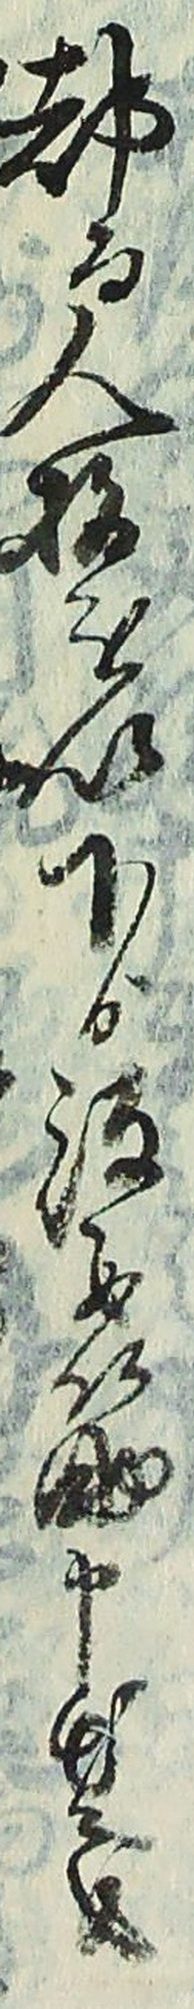四十五都而人指を以下ゟ役義筋申出之義
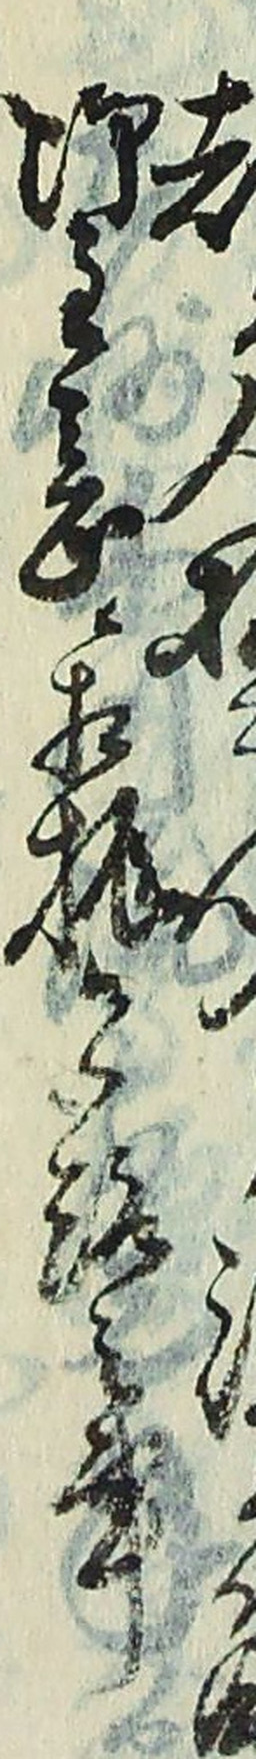御主意ニ相振候御趣之事
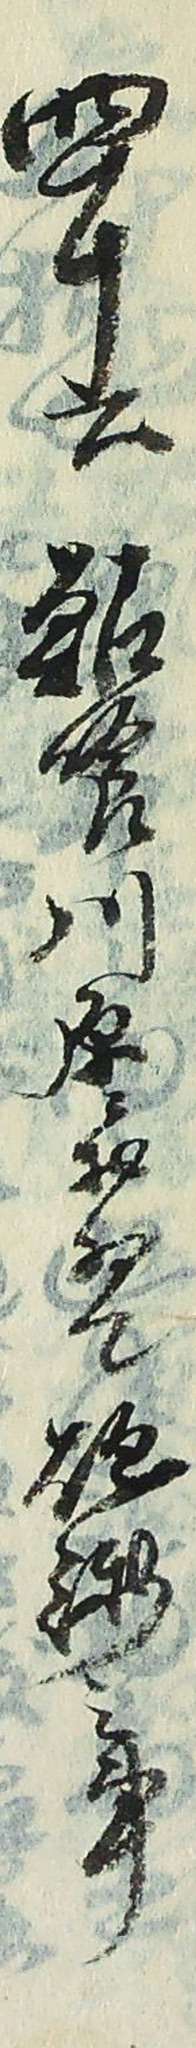四十六鮎喰川原ニおゐて炮術之事
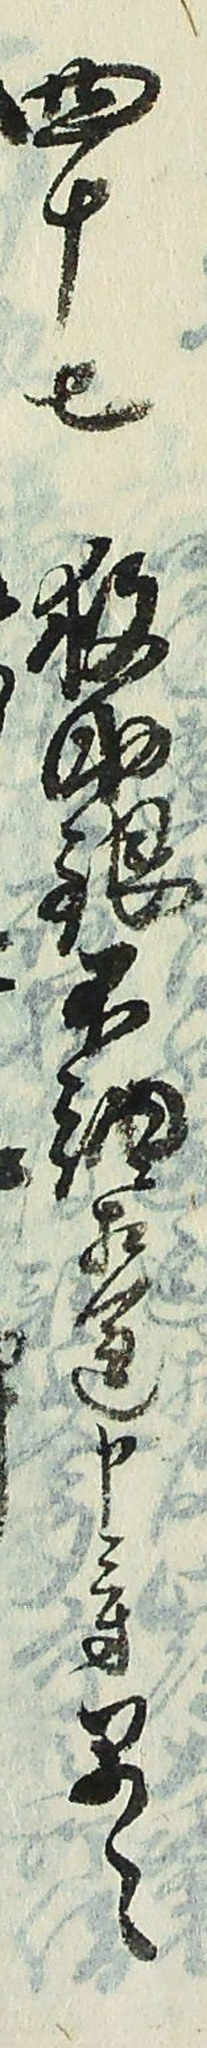四十七救助銀不納ニ相運申ニ付早々
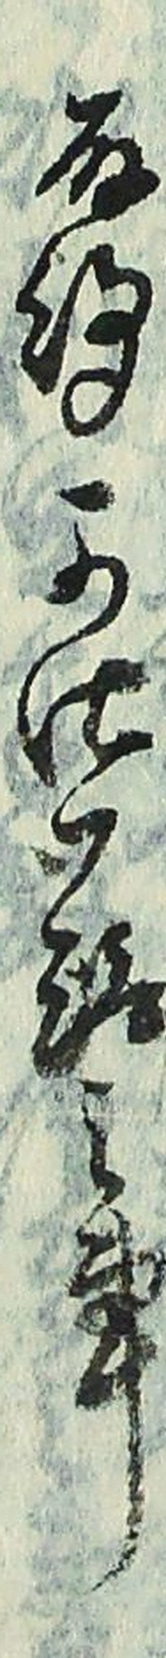取約メ可仕御趣之事
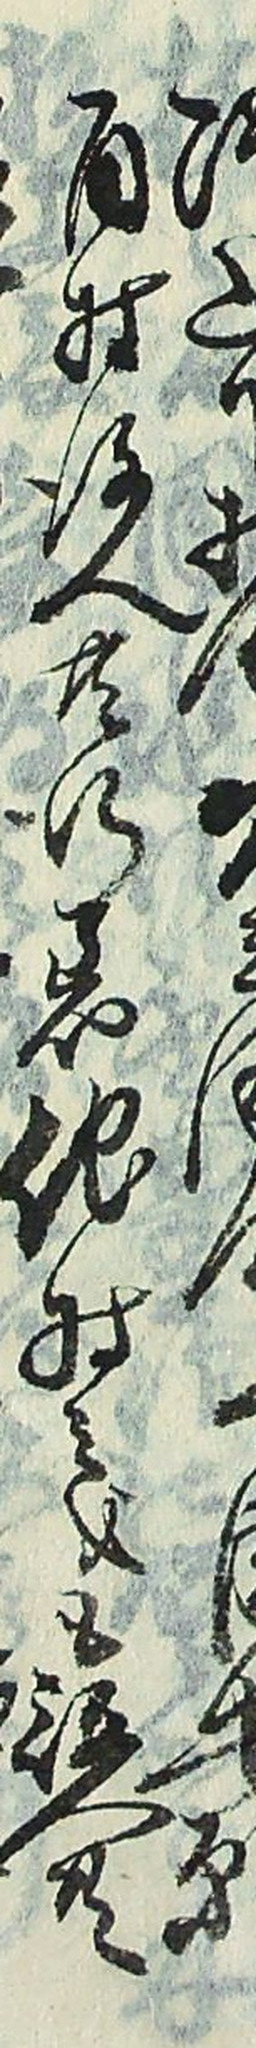自村役人共行着他村之義も役人共
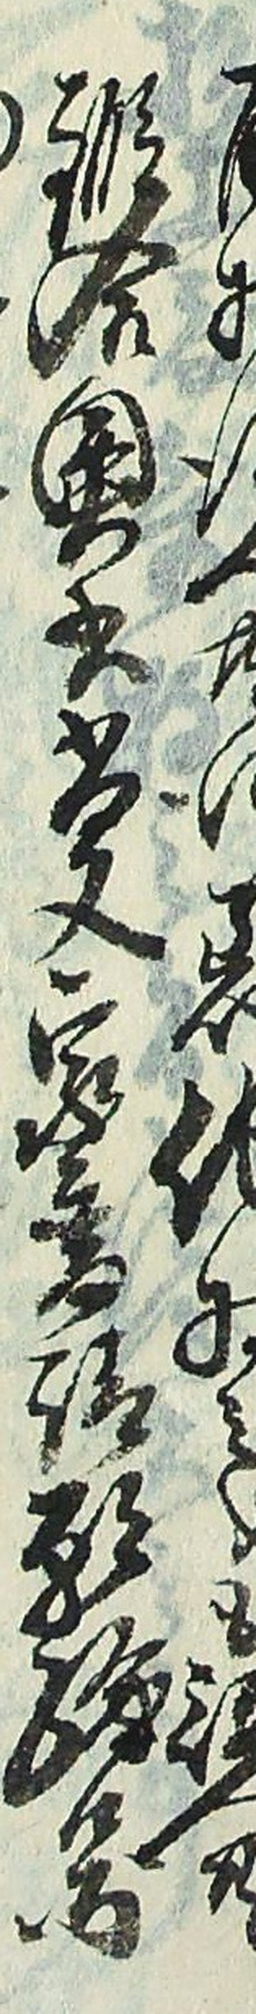鍛合奥書尚又家普請願繪圖
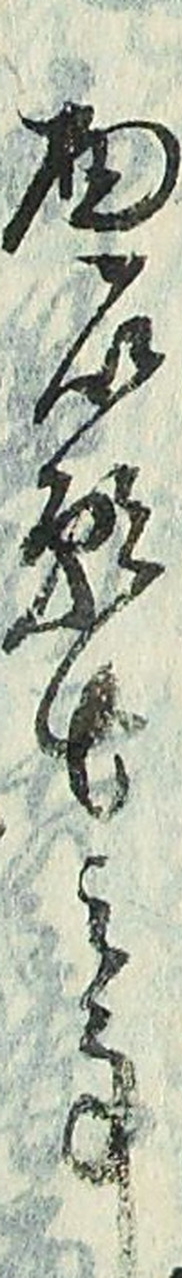面ヲ以願出之事
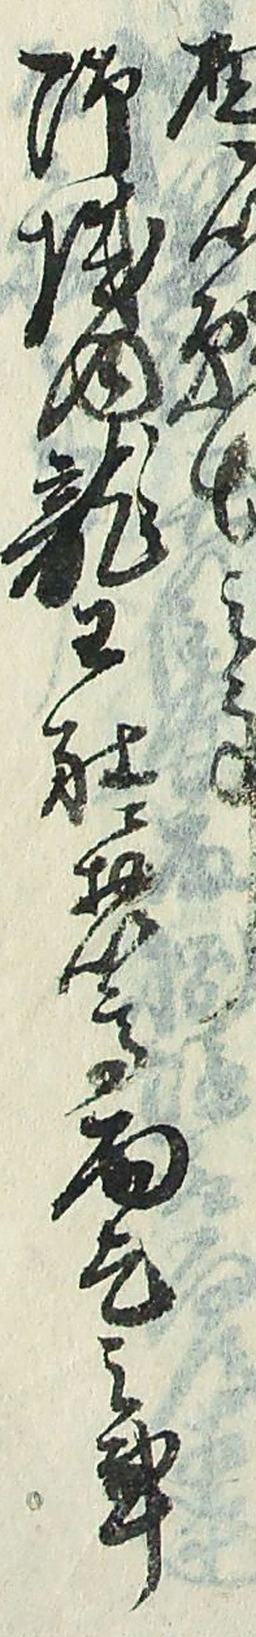五十御城内龍王社ニおいて雨乞之事

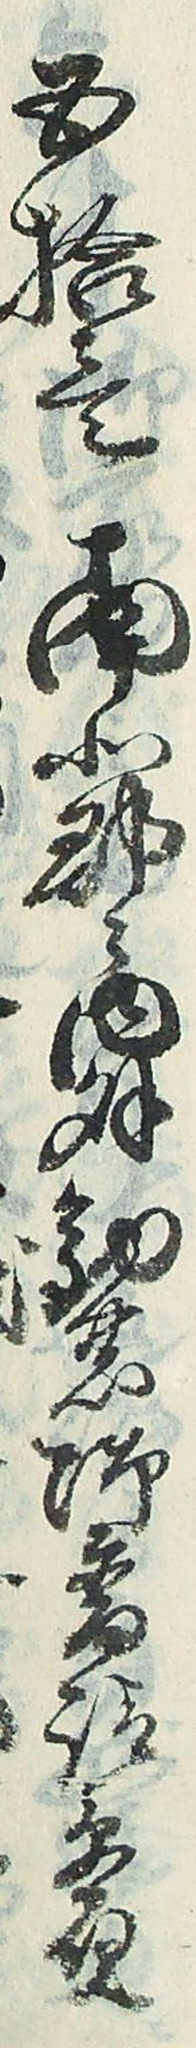五拾壱南北郡之内外勧農御普請受負
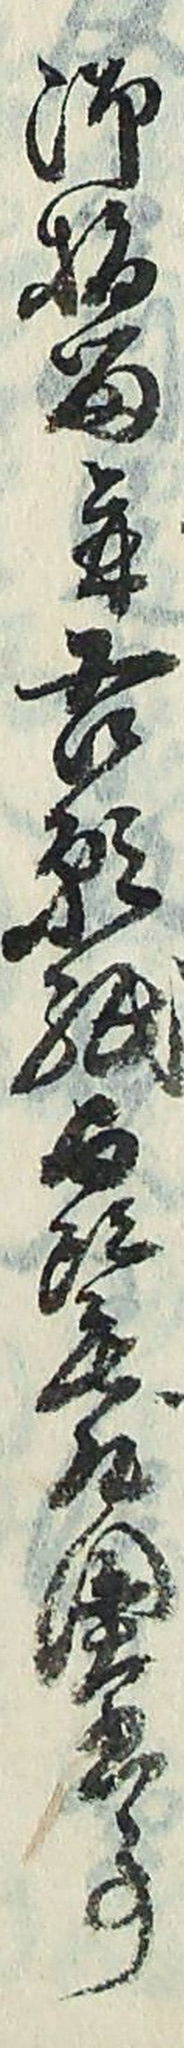御指留幷右願紙与頭庄屋奥書事
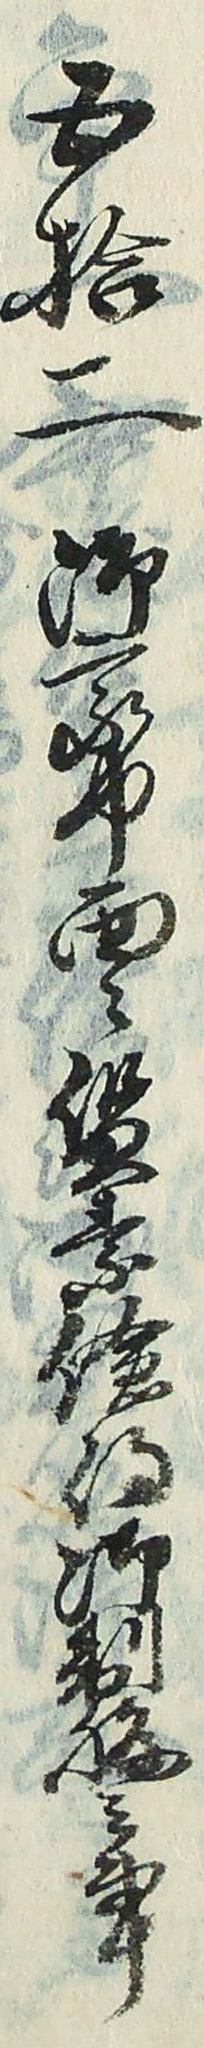五拾二御家中面々質素倹約御制服之事
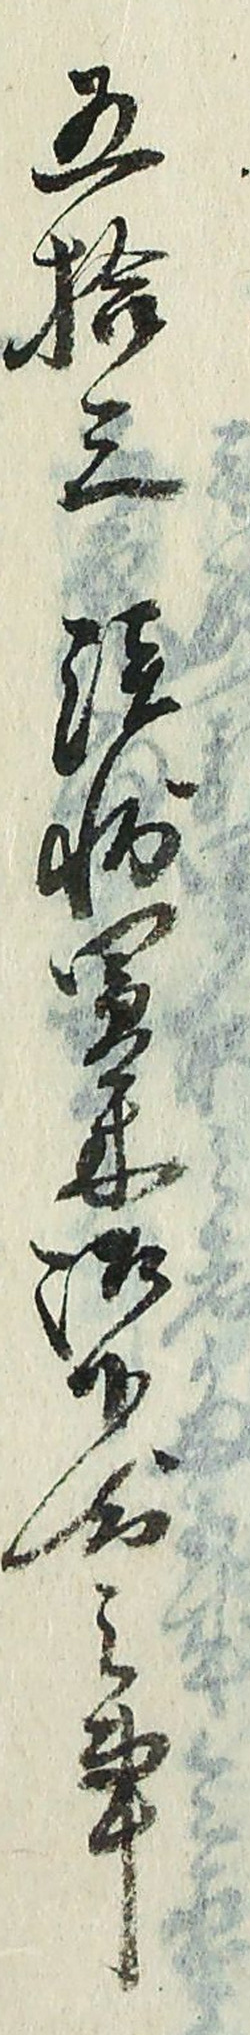五拾三淡州買米御下知之事
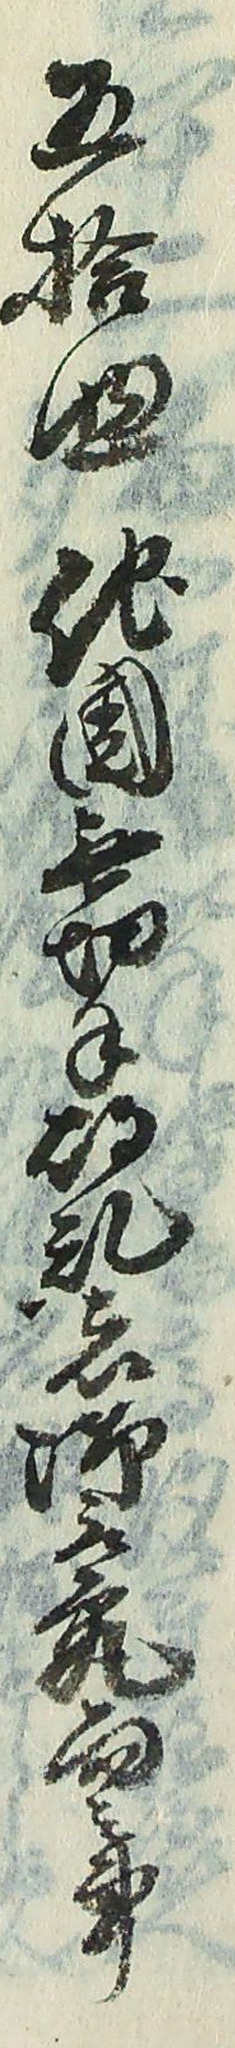五拾四他国無切手胡乱者御取究向之事
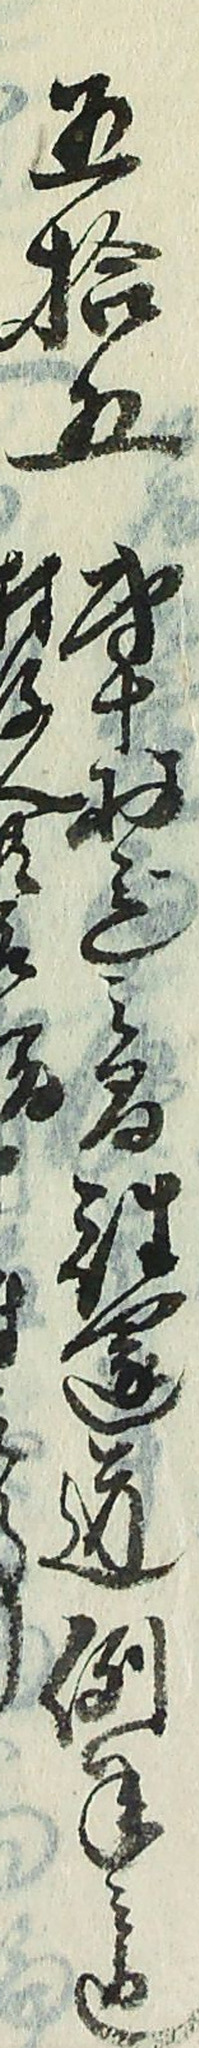五拾五第十村迄之間往還道例年之通
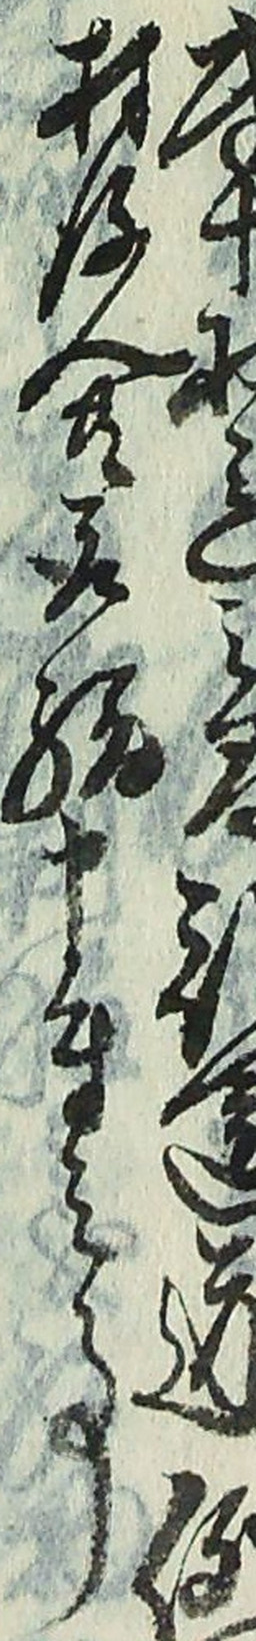村役人共取繕申付之事
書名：諸御趣意書并御下知向之写
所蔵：鳴門教育大学 Naruto University of Education
